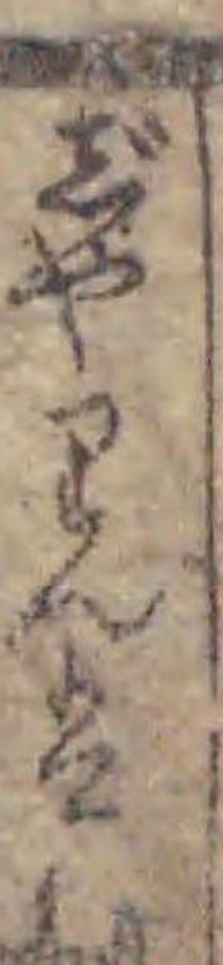じやりんは
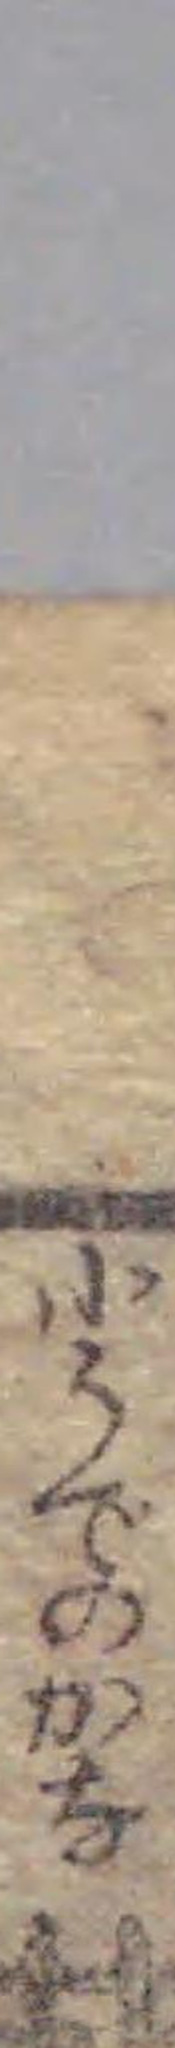小うでのかな
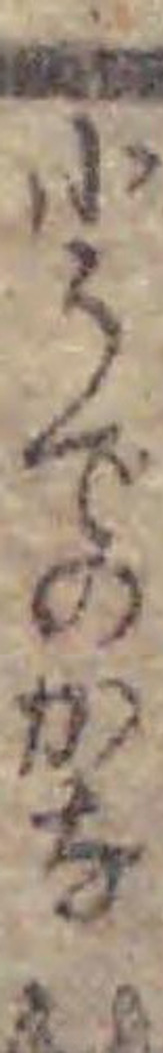小うでのかな
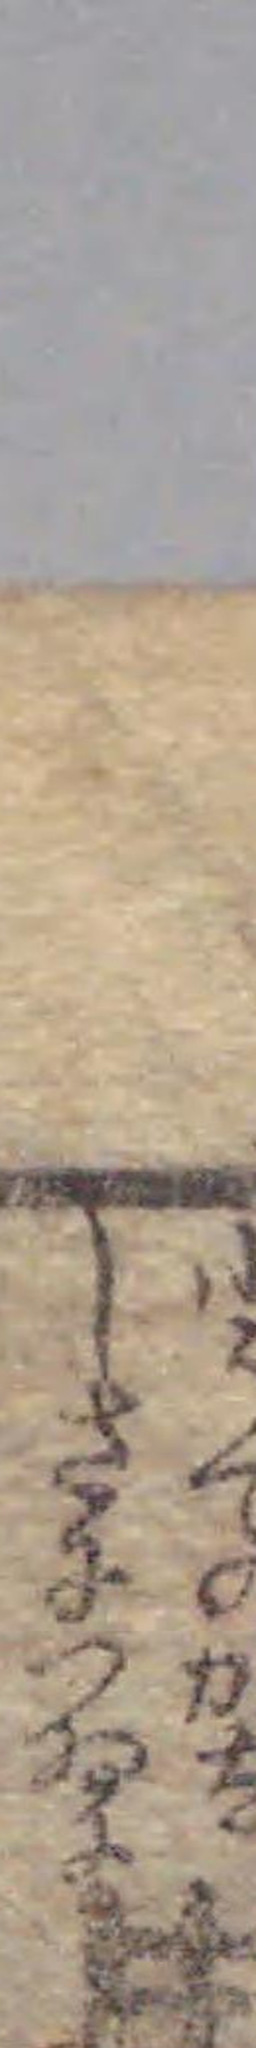しさにつゐに
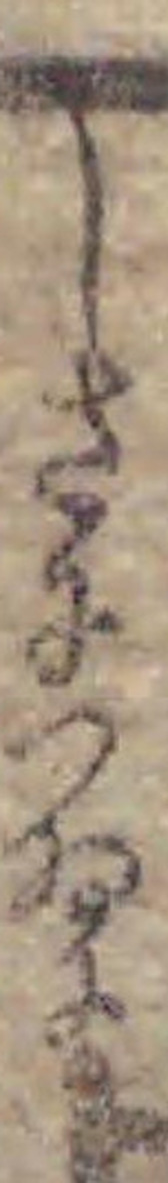しさにつゐに
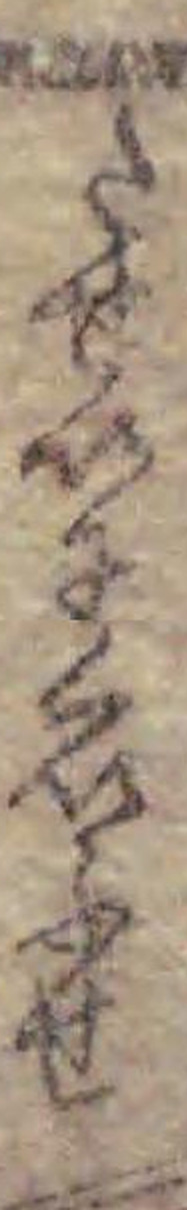たせいにくいふせ
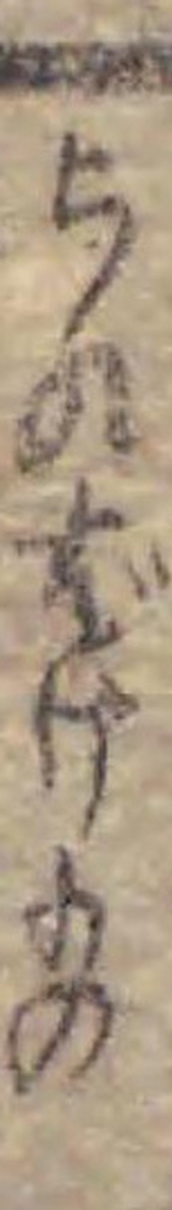らればけもの
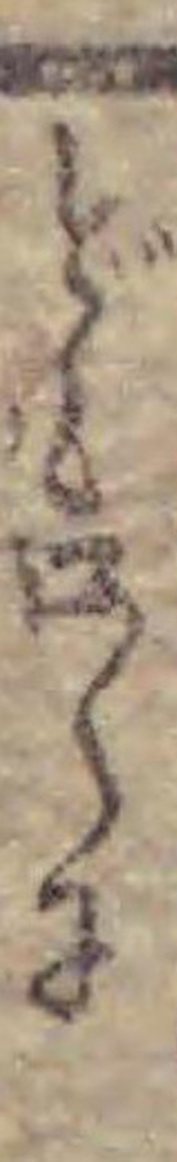ども口〳〵に
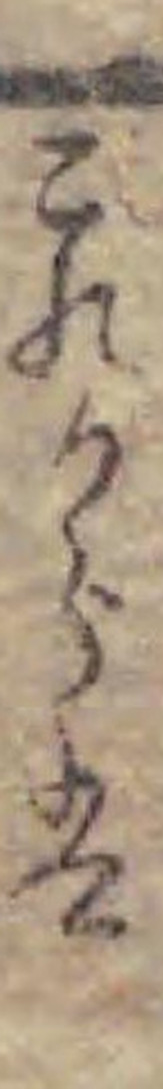これからは
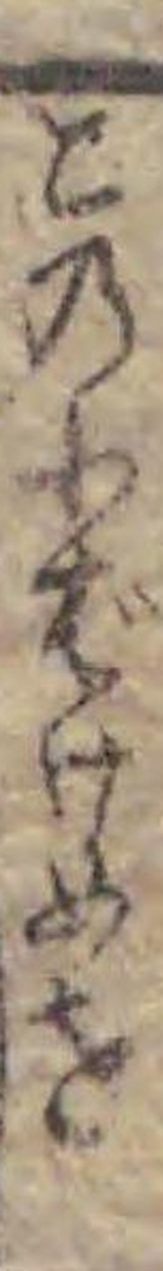この小ばけめを
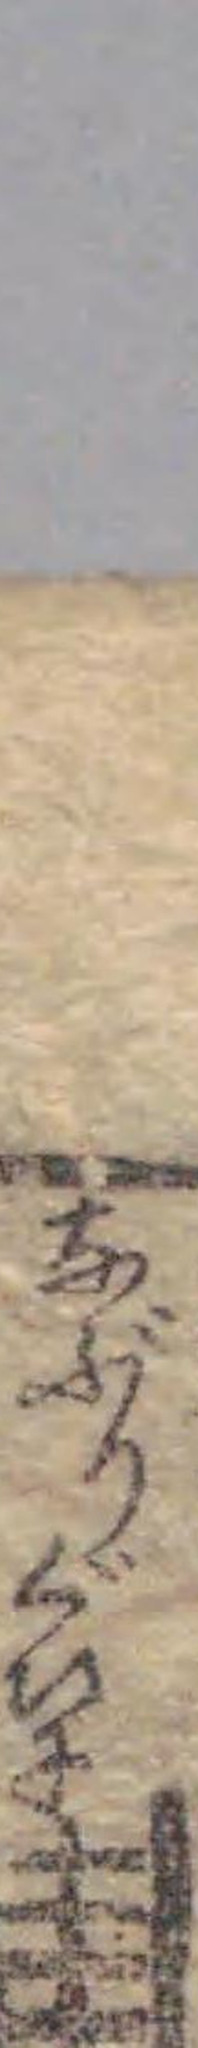なぶりぐいに
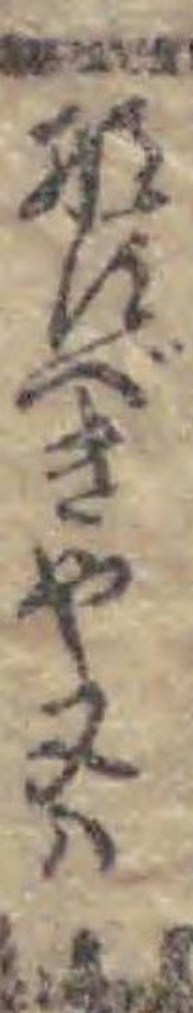なすべきや又は
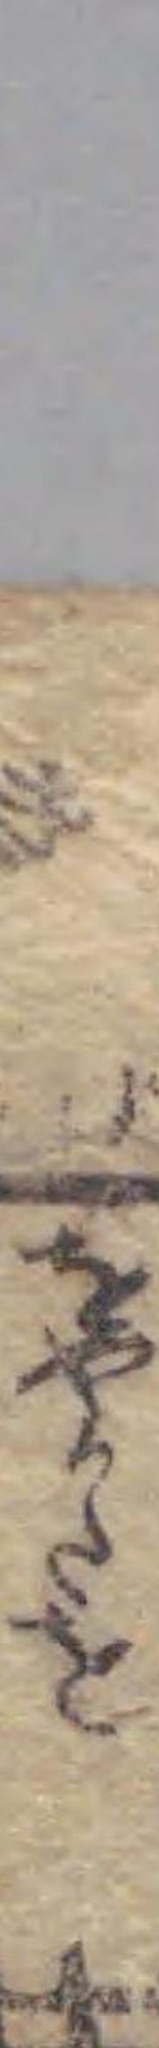をやかたを
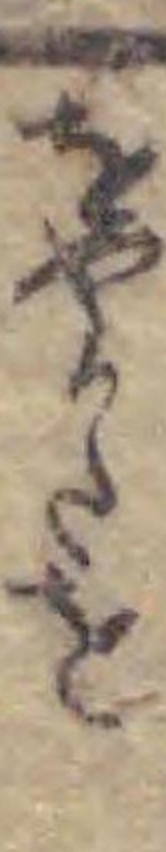をやかたを
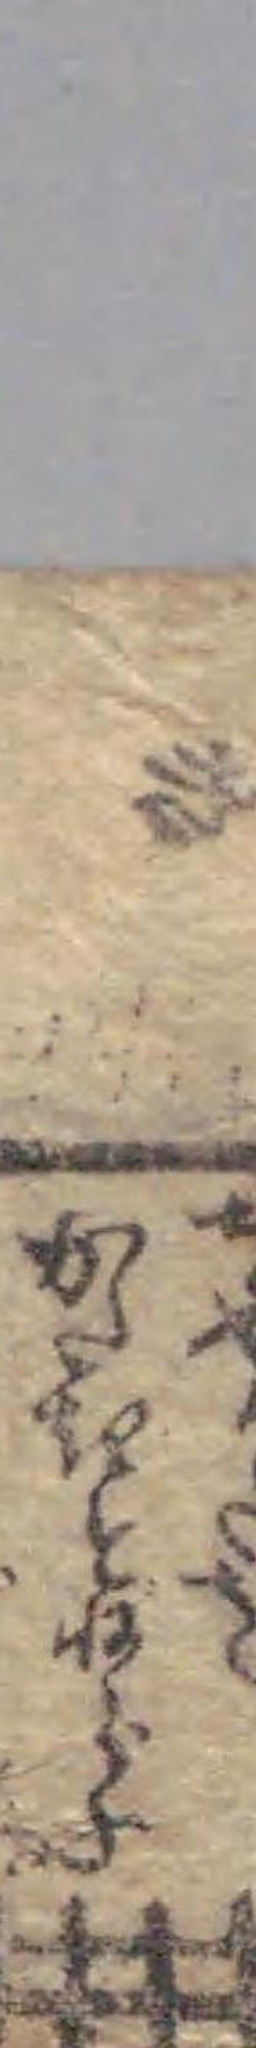かたきとねらふ
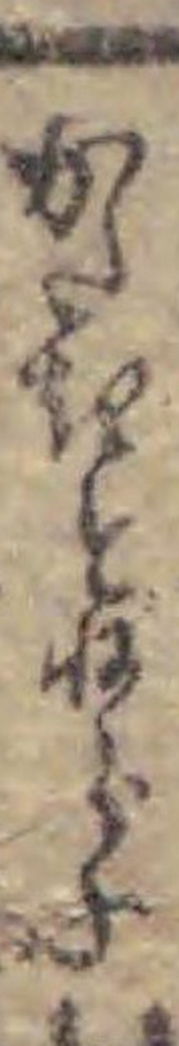かたきとねらふ
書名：化物世界夜半嵐 : 3巻
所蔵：国立国会図書館 National Diet Library, JAPAN
